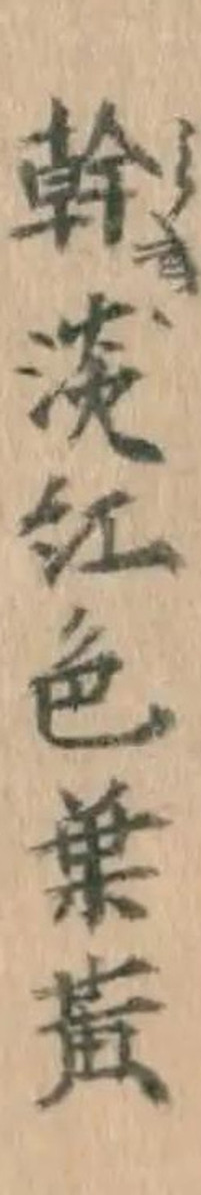幹淡紅色葉黄
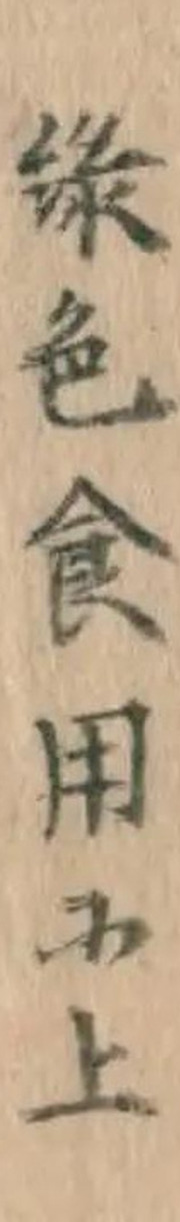緑色食用に上
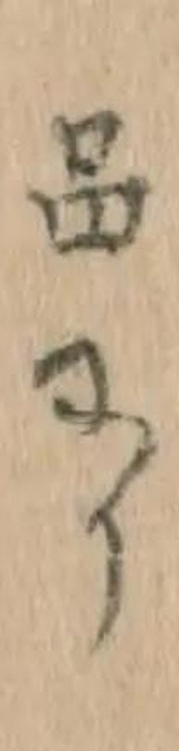品なり
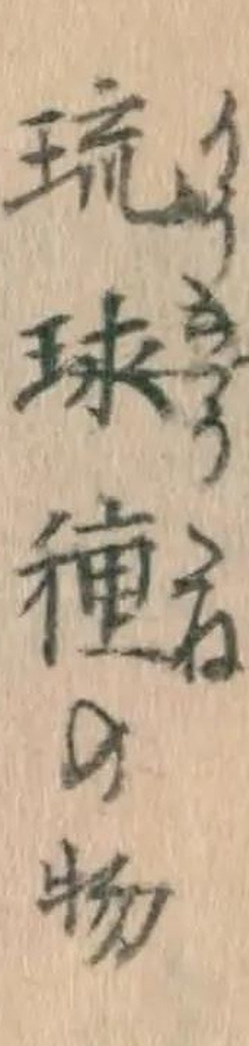琉球種の物
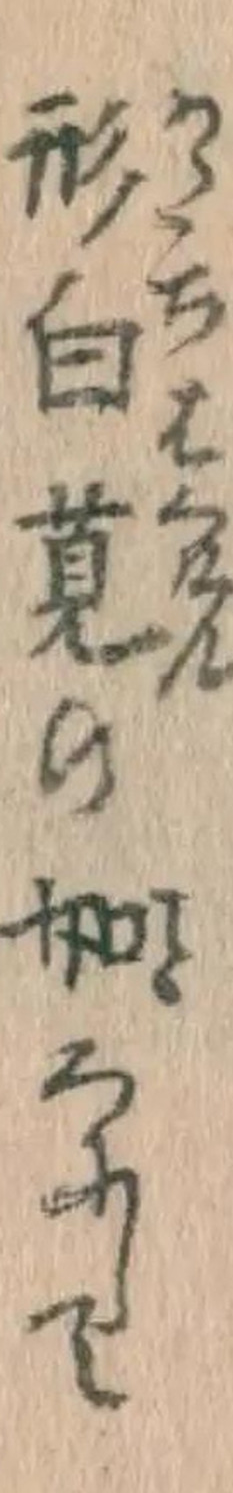形白莧の如くにして
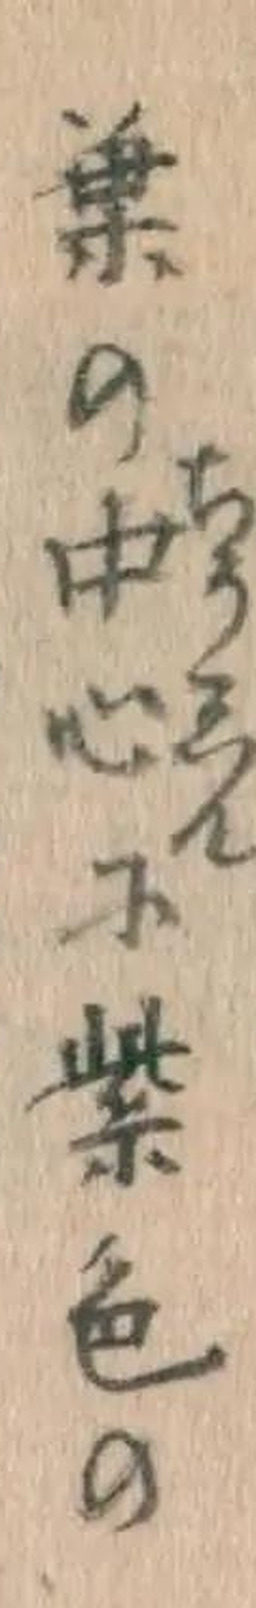葉の中心に紫色の
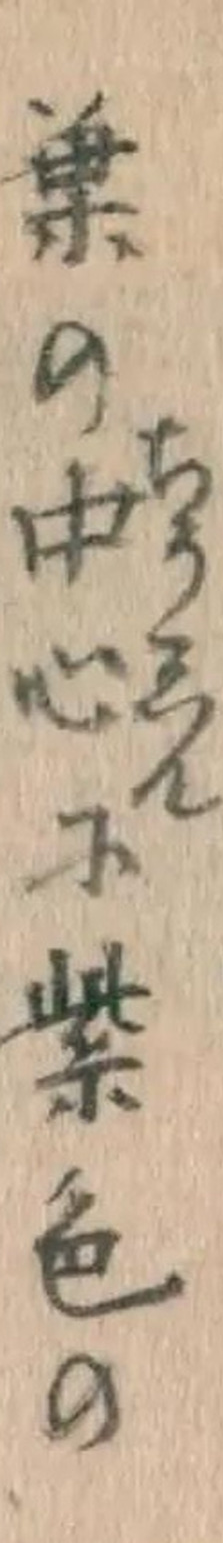葉の中心に紫色の
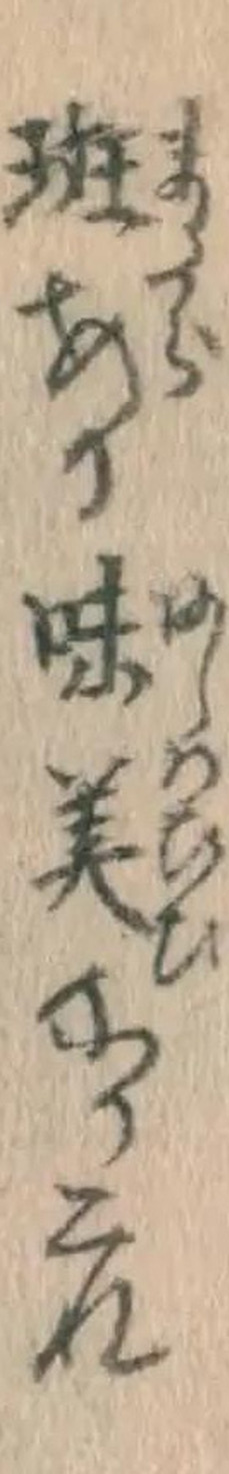斑あり味美なりこれ

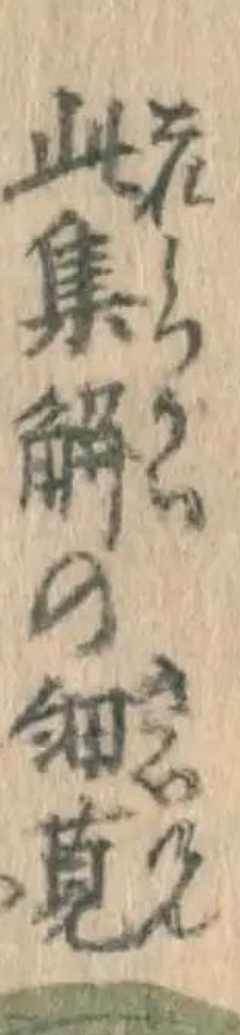此集解の細莧
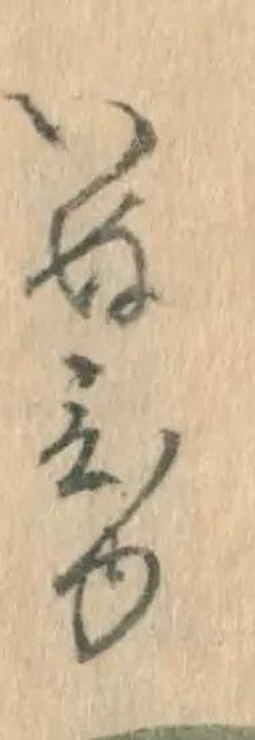いぬひゆ
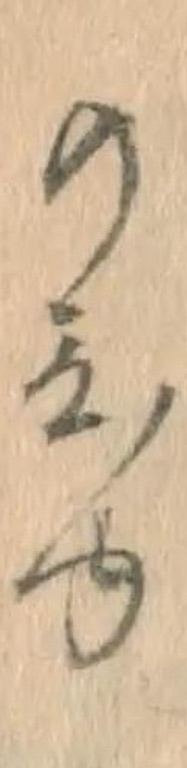のひゆ
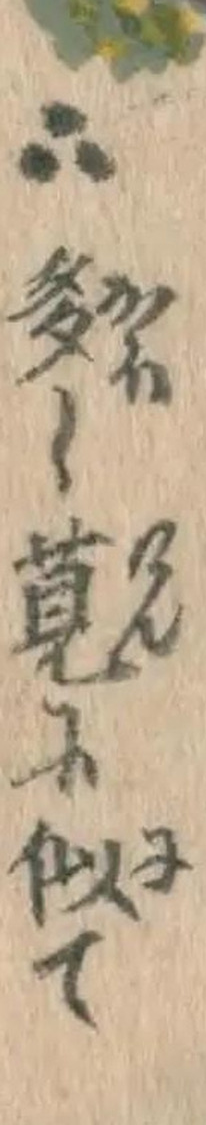∴多し莧に似て
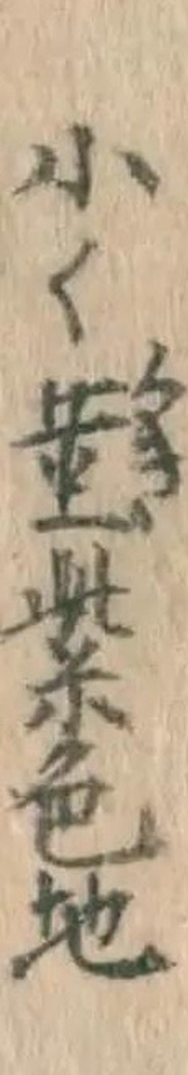小く茎紫色地
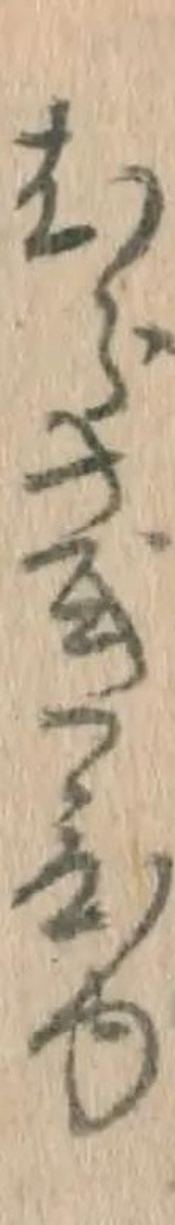むらさきひゆ
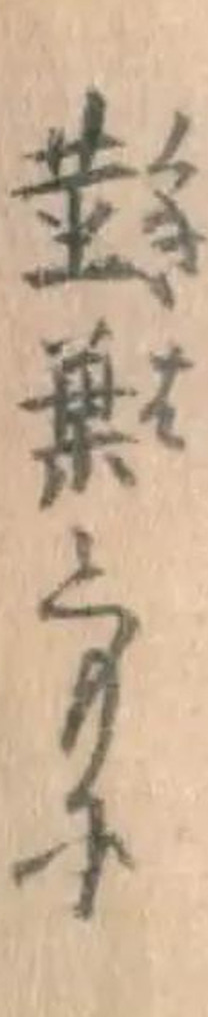茎葉ともに
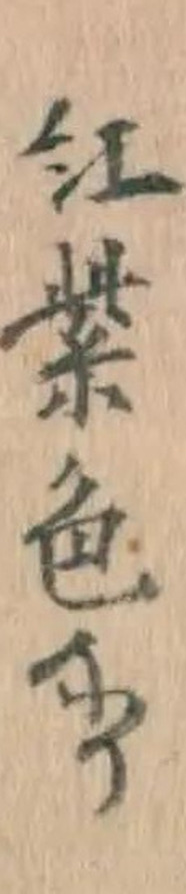紅紫色なり
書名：本草図譜. 巻46-48
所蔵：国立国会図書館 National Diet Library, JAPAN
